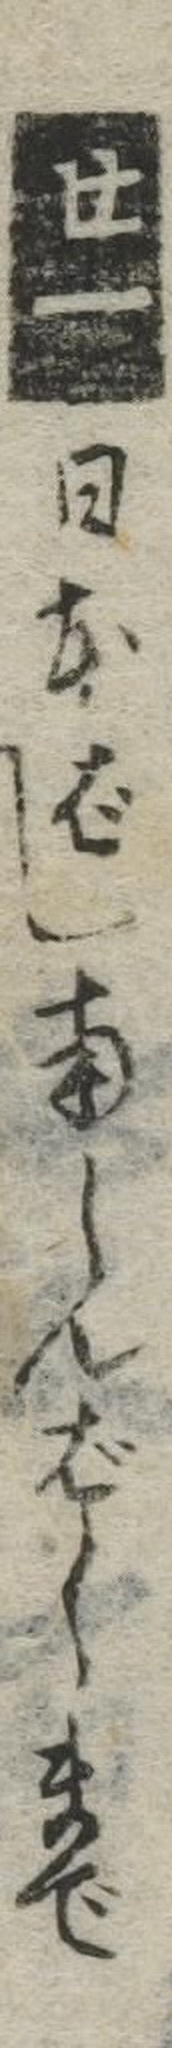廿一日本ばし南しんばしまで
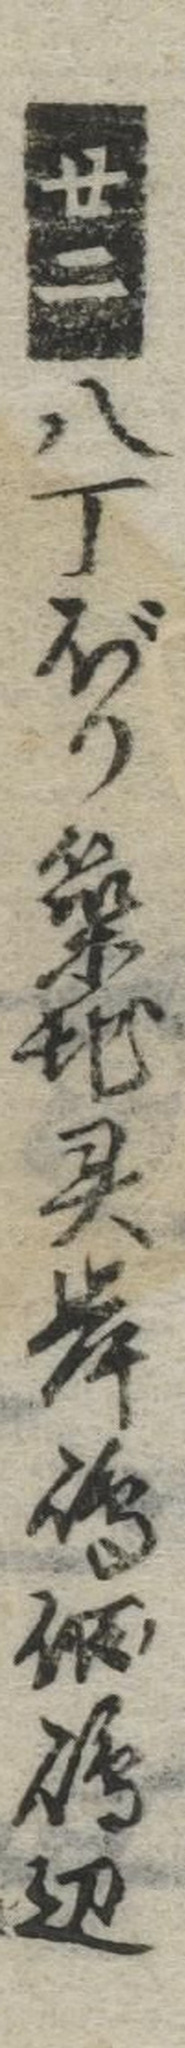廿二八丁ぼり築地灵岸嶋佃嶋辺
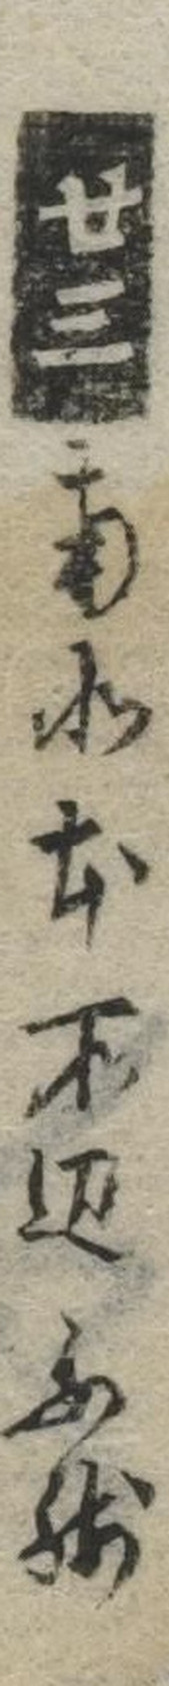廿三南北本所辺不残
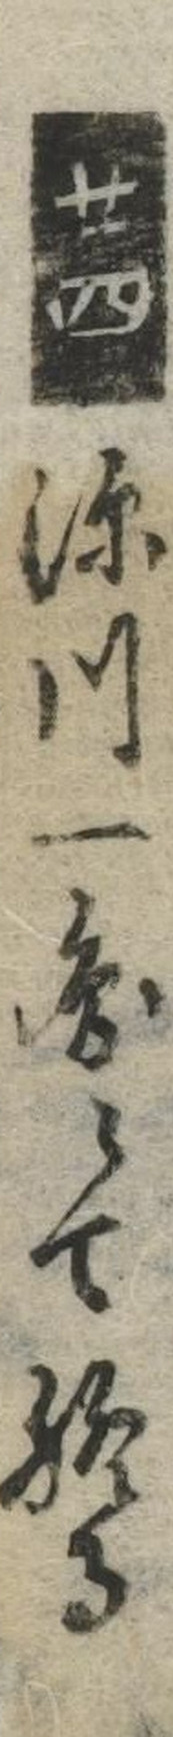廿四深川一円にて終る

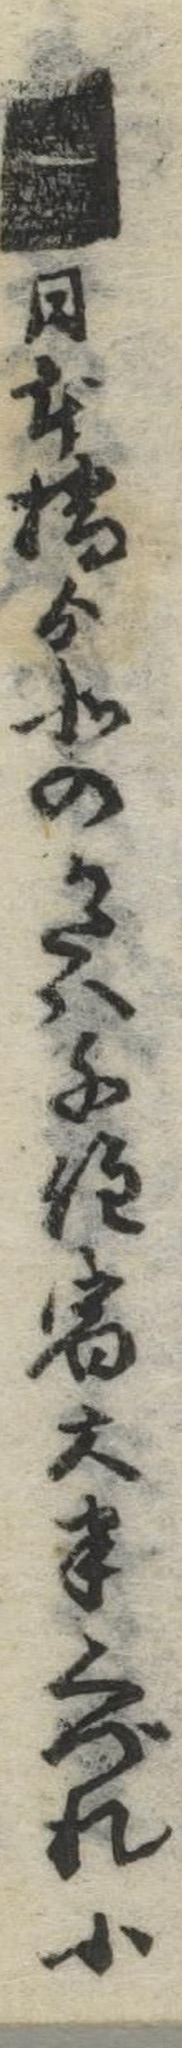一日本橋ゟ北のかたハ千住宿大半くずれ小
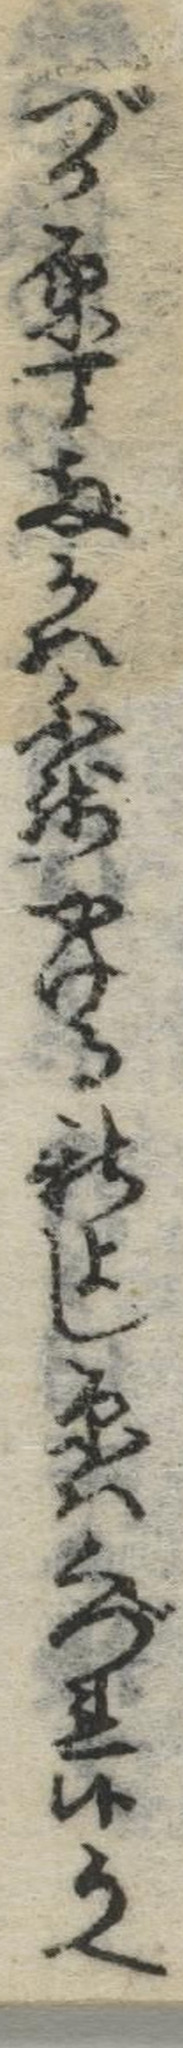づか原丁両かハ不残やける新よし原ハくづれ候うへ
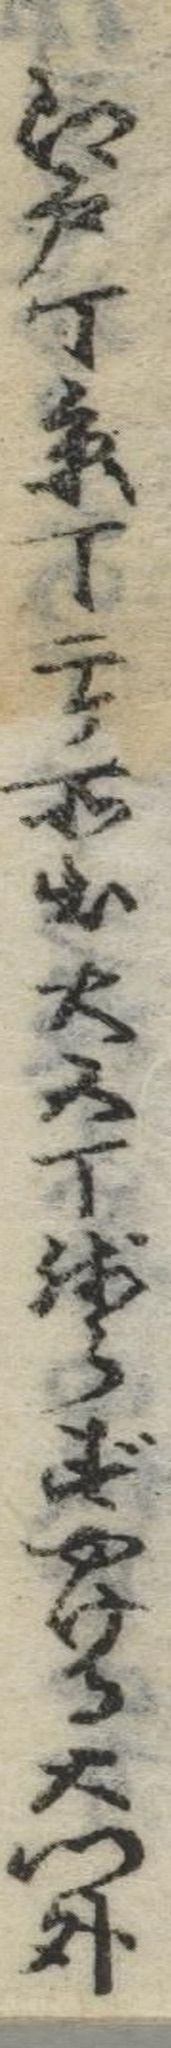江戸丁京丁二ヶ所出火五丁残らずやける大門外
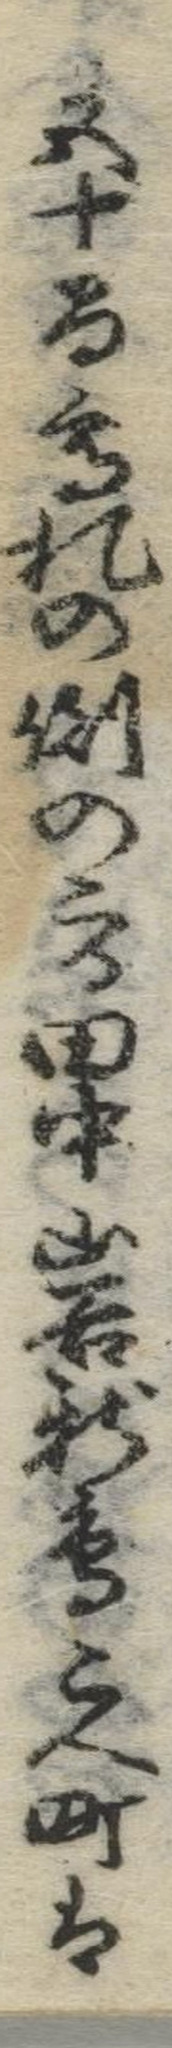五十間高札の側の方田中山谷新鳥こへ町
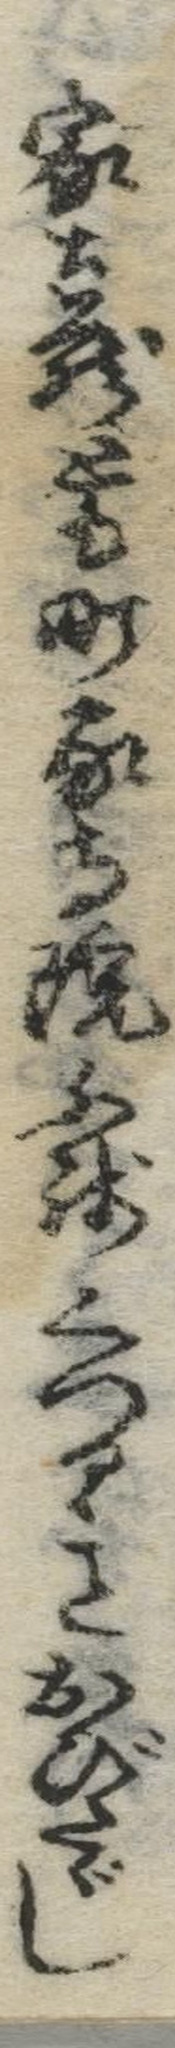家土蔵とも町家寺院不残くつるゝことおびたゞし
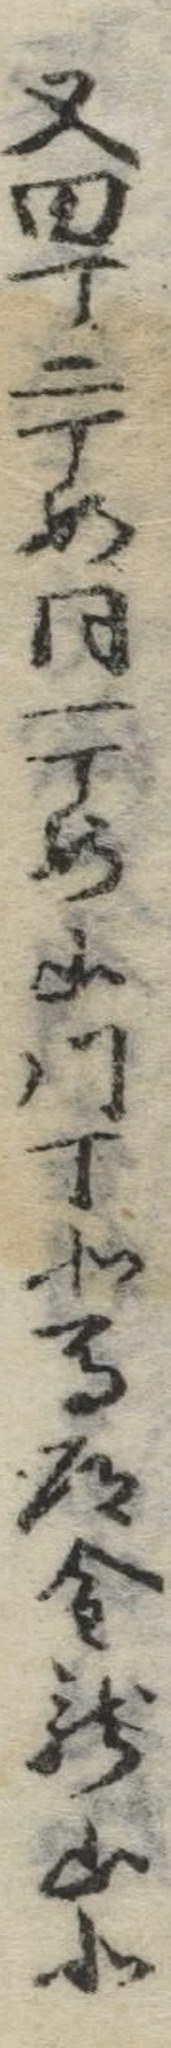又田丁二丁め同一丁め山川丁北馬道金龍山北
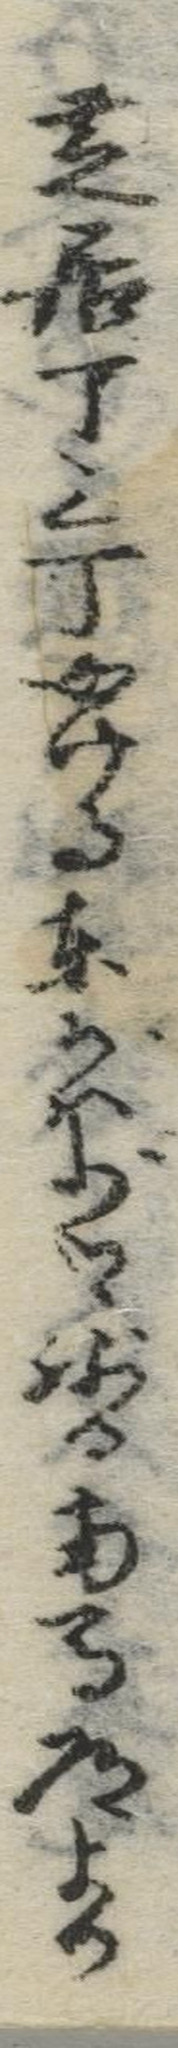芝居丁三丁やける東かハ少つゝ残る南馬道より
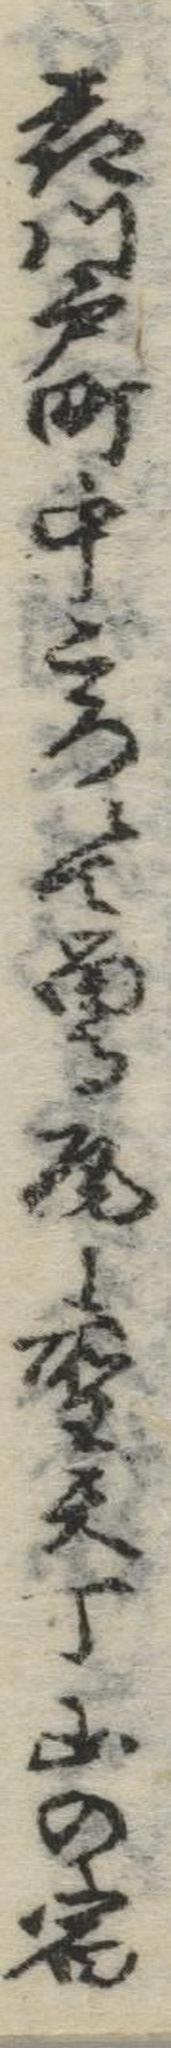花川戸町中ころにて留る瓦丁聖天丁山の宿
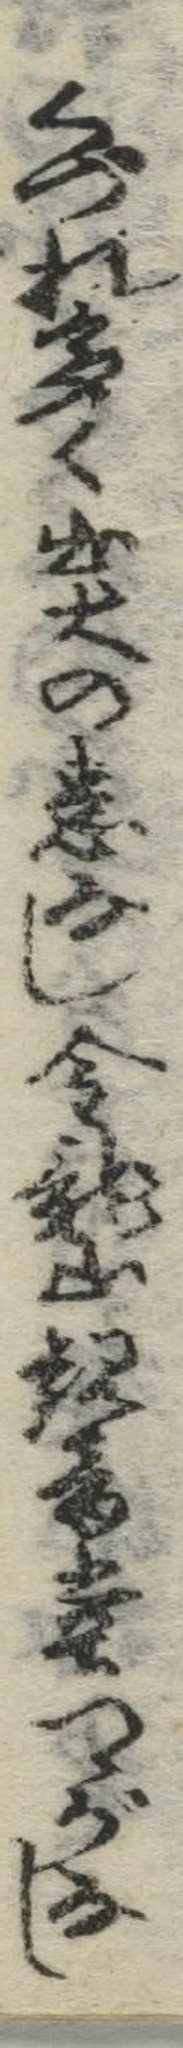くづれ多く出火の患なし金龍山観音堂つゝがなし
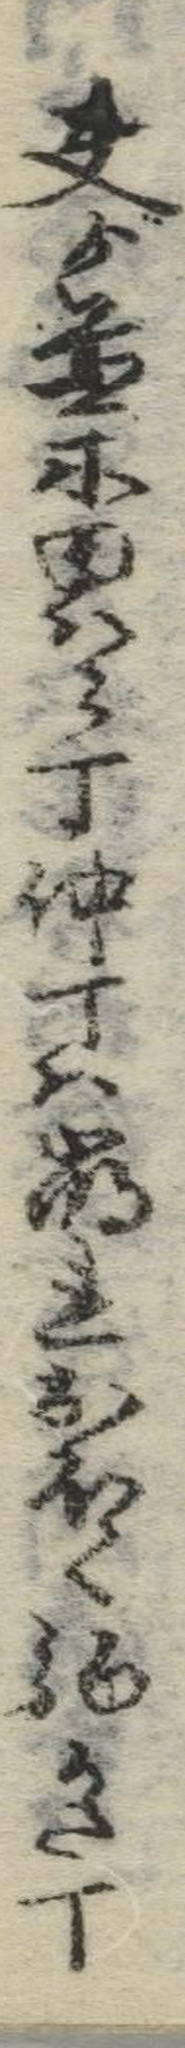夫ゟ並木丁田はら丁仲丁は崩れおほく駒かた丁
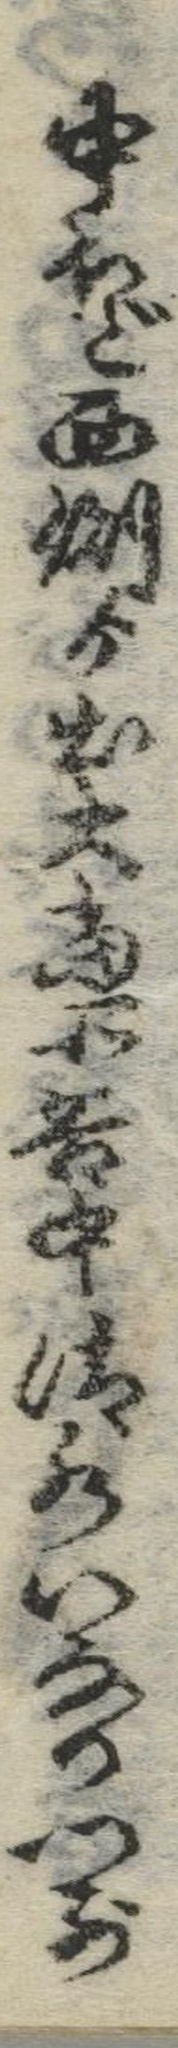中程西側ゟ出火当所谷中清水いなり門前
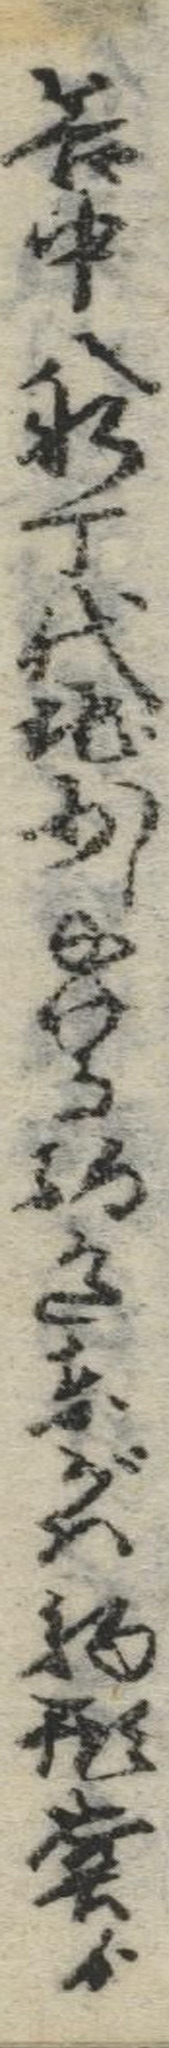谷中八軒丁代地少しやける駒かた東がハ駒形堂ゟ
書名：安政二卯十月二日夜四ツ時過　御府内御屋敷方市中共　地震類焼場所明細書之寫　并街道筋近郷聞書
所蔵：東京大学地震研究所図書室 Earthquake Research Institute Library, The University of Tokyo, JAPAN
